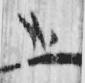之
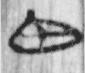甶（思）
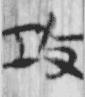攻
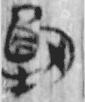解
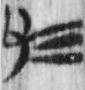於
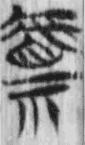○（詛）
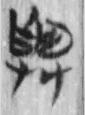與
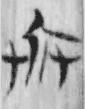兵
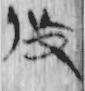死
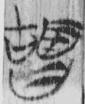○（盬）
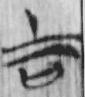吉
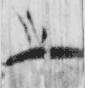之
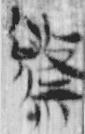○（敓）
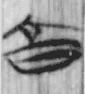亯
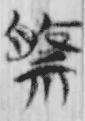祭
